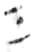乃
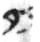多
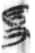○（得）
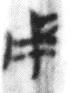用（甬）
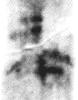不
